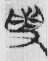受
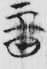○（期）
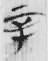辛
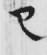巳
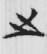之
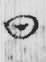日
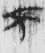不
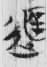𬨭（將）
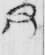尹
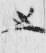之
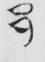邑
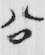公
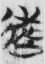遠
